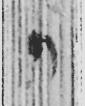人
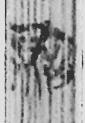則
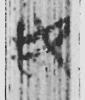女
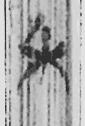禾
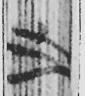之
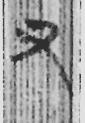又
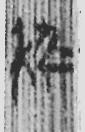{禾U}
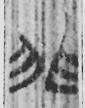非
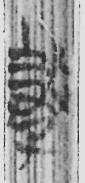{㱿子}
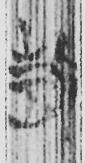折
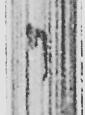人
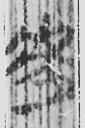𫊟（吾）
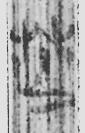{𣏟止}
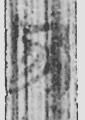所
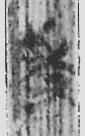爰
